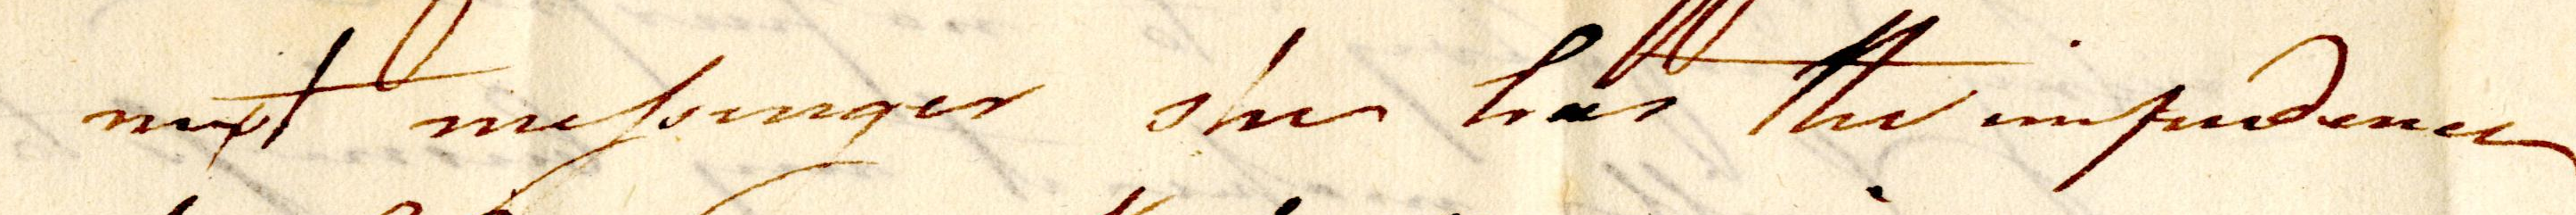next messenger she has the impudence
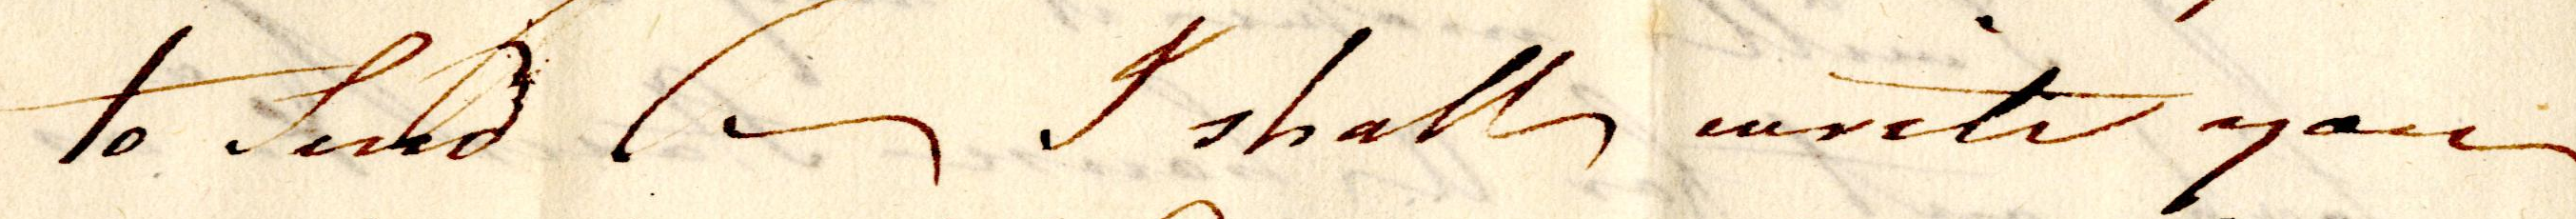to send.- I shall write you
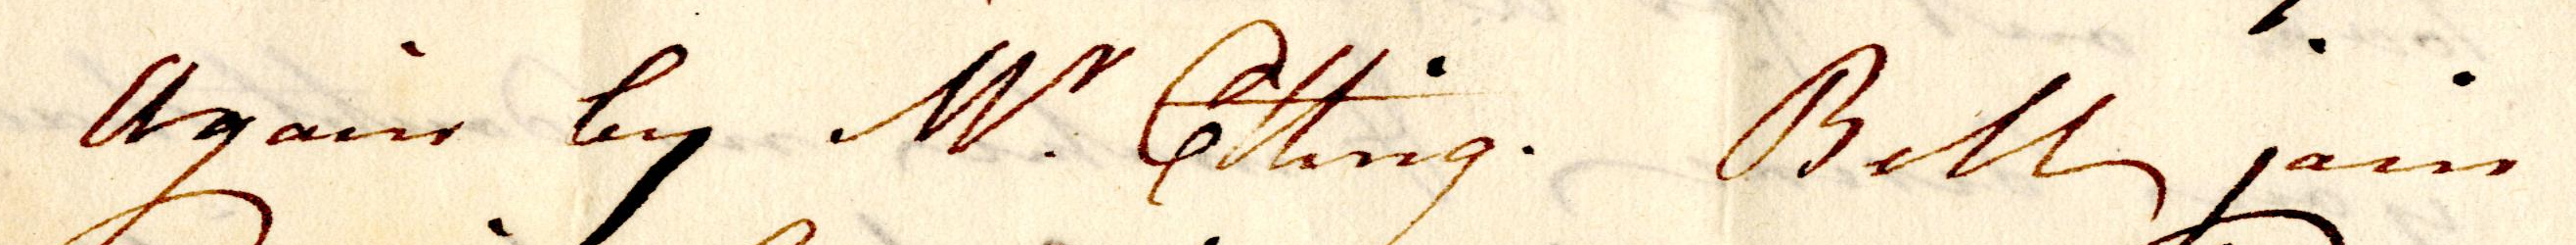Again by M^r. Etting. Bell joins
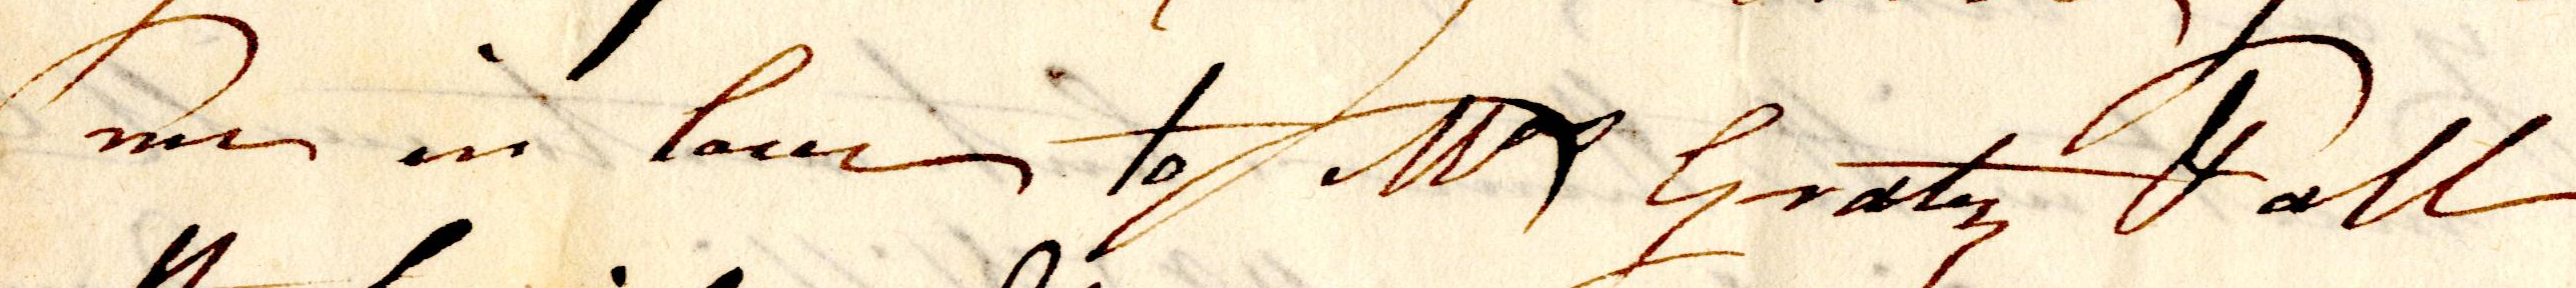me in love to M^r Gratz & all
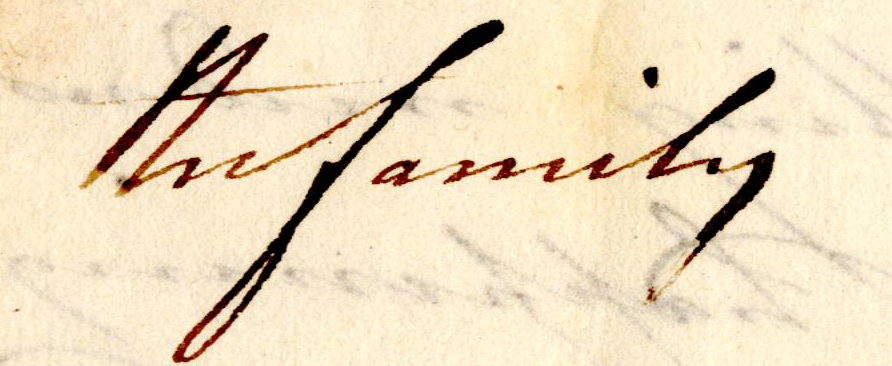the family
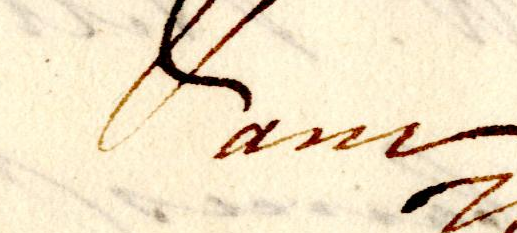& am
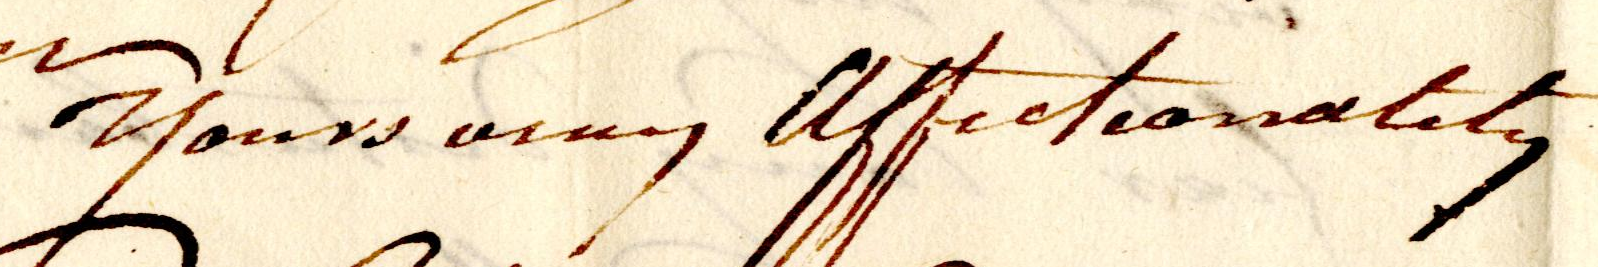Yours very Affectionately
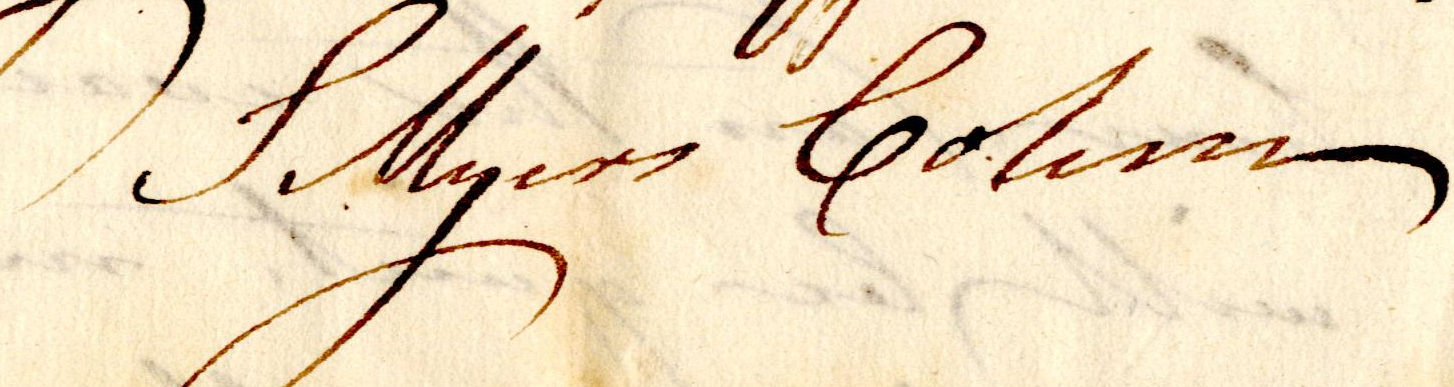S Myers Cohen
